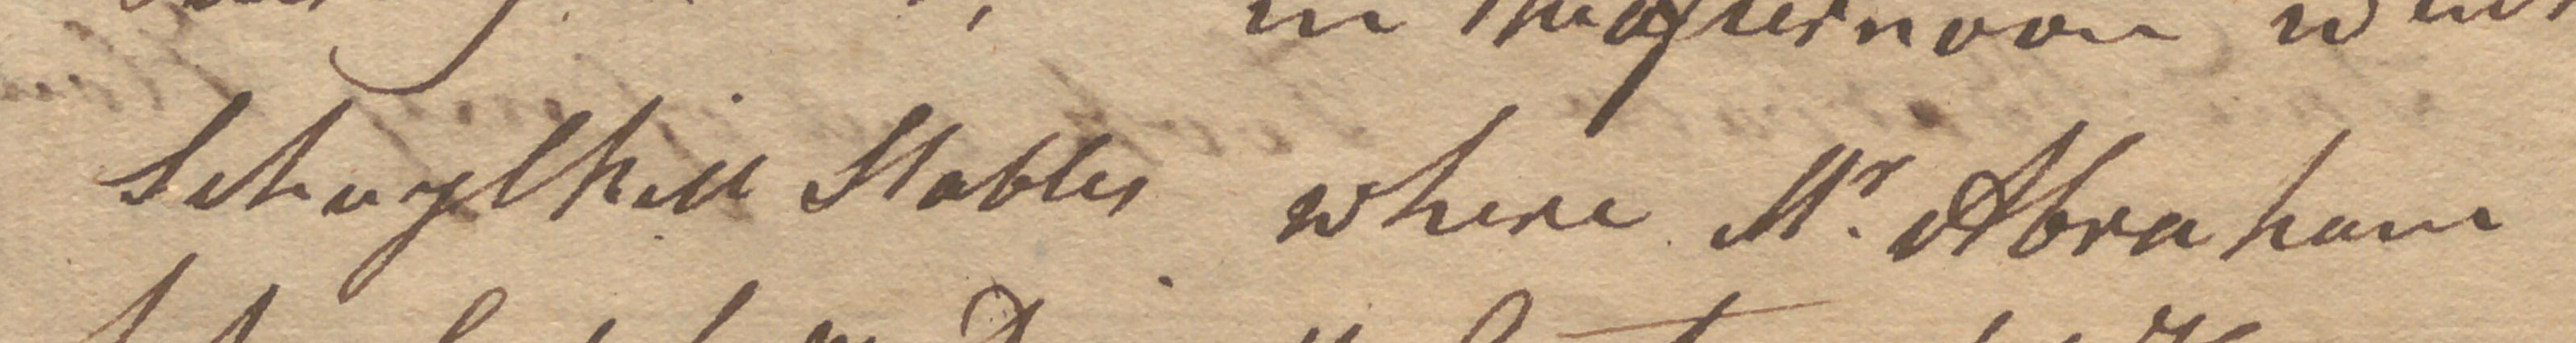Schuylkill Stables where M^r. Abraham
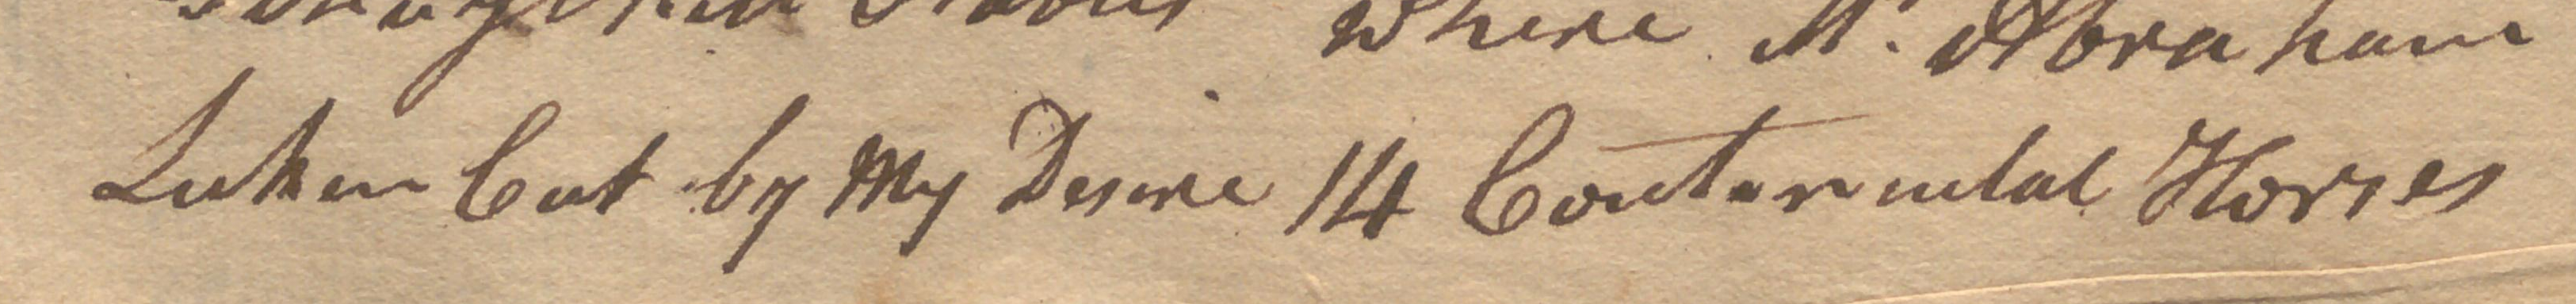Luken Cut by My Desire 14 Continental Horses
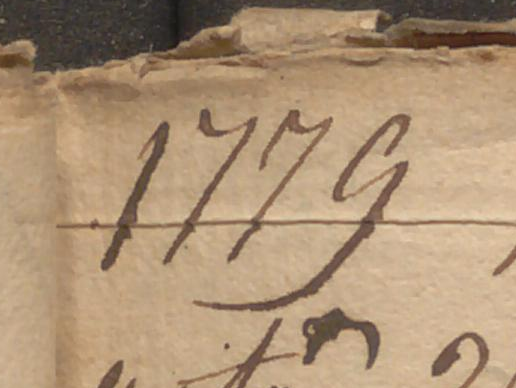1779
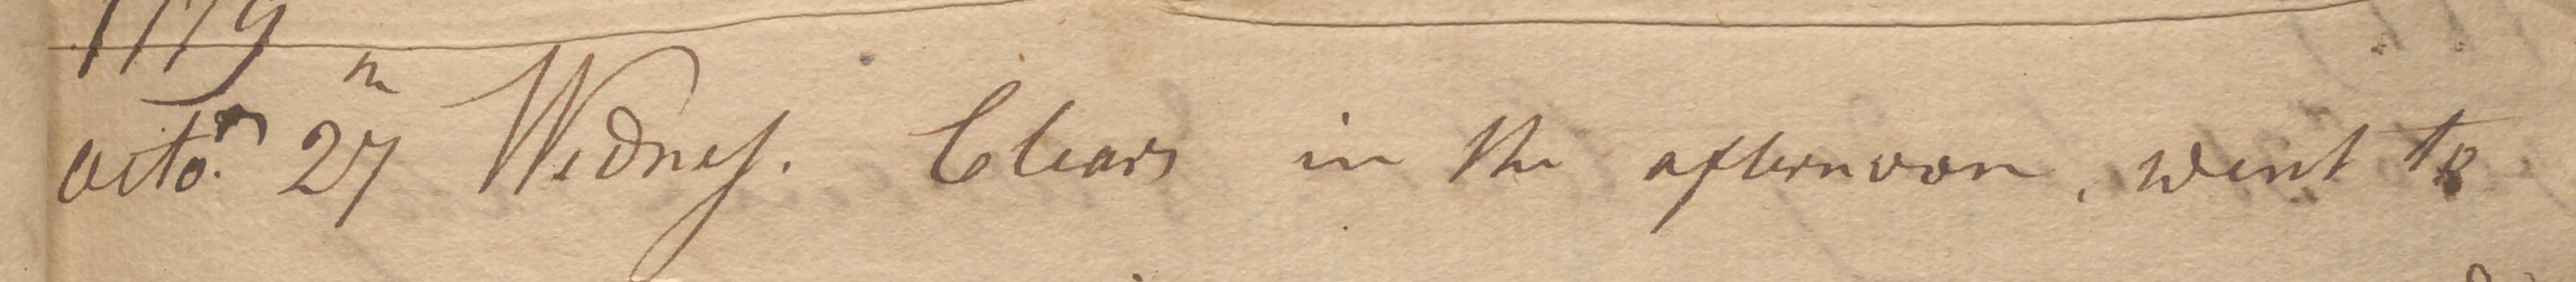Octo^r. 27 Wednes. Clear in the aftenoon. went to
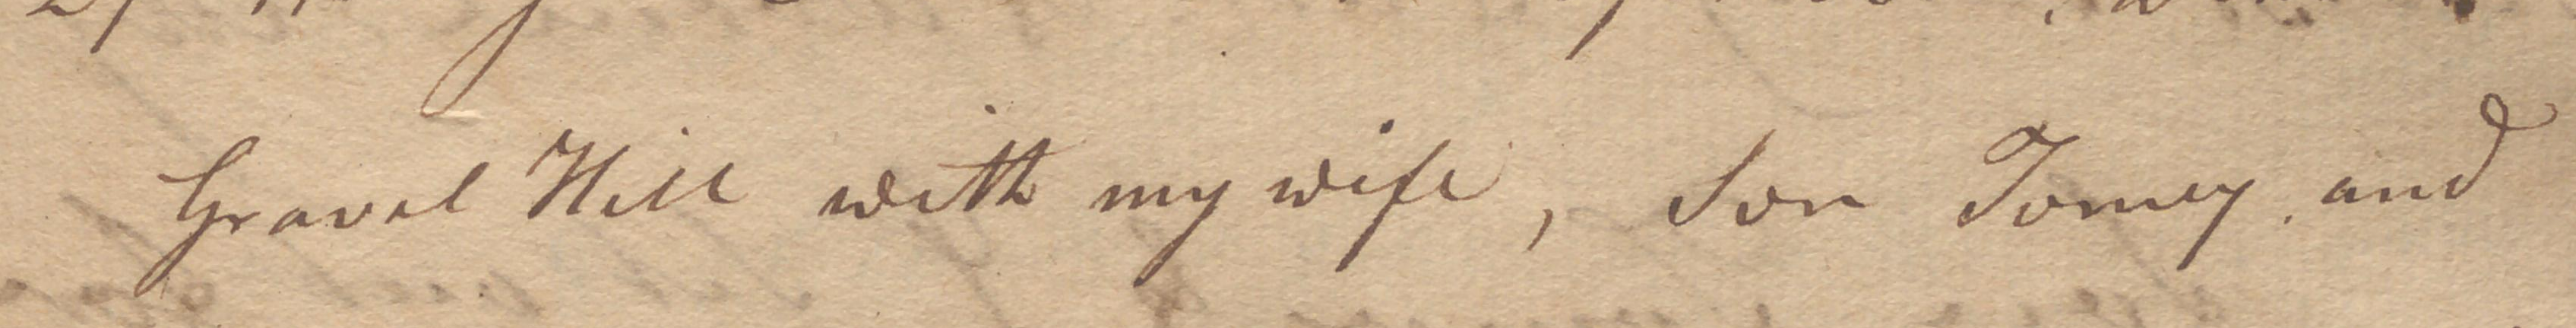Gravel Hill with my wife, Son Tomey and
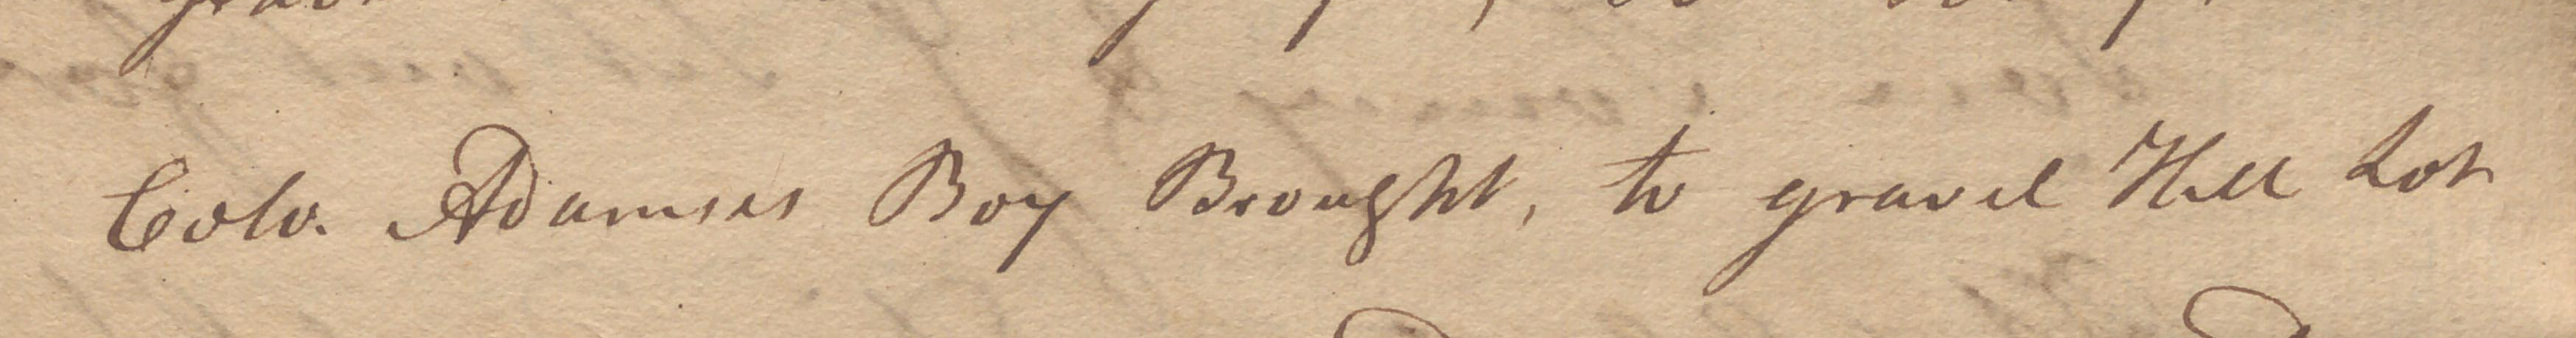Colo. Adamses Boy Brought, to gravel Hill Lot
